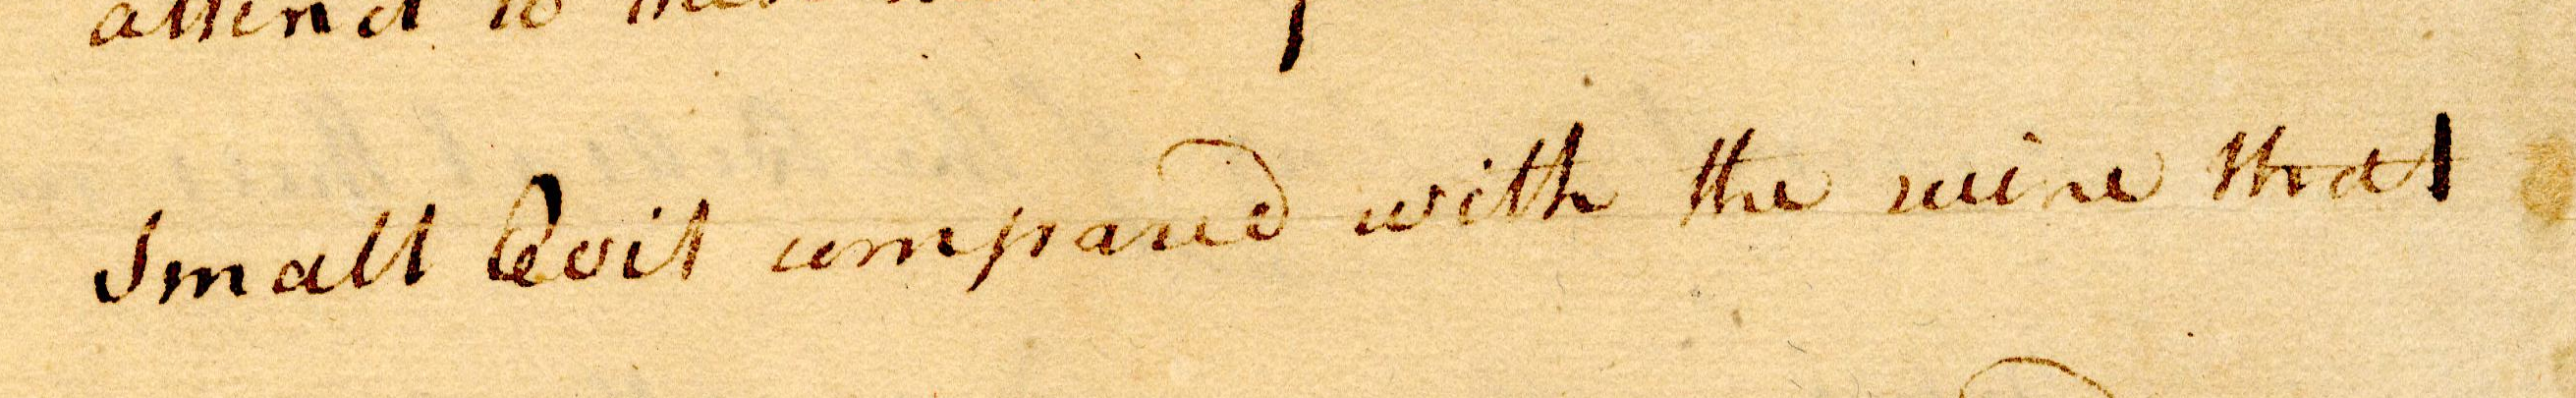small Evil compared with the wine that
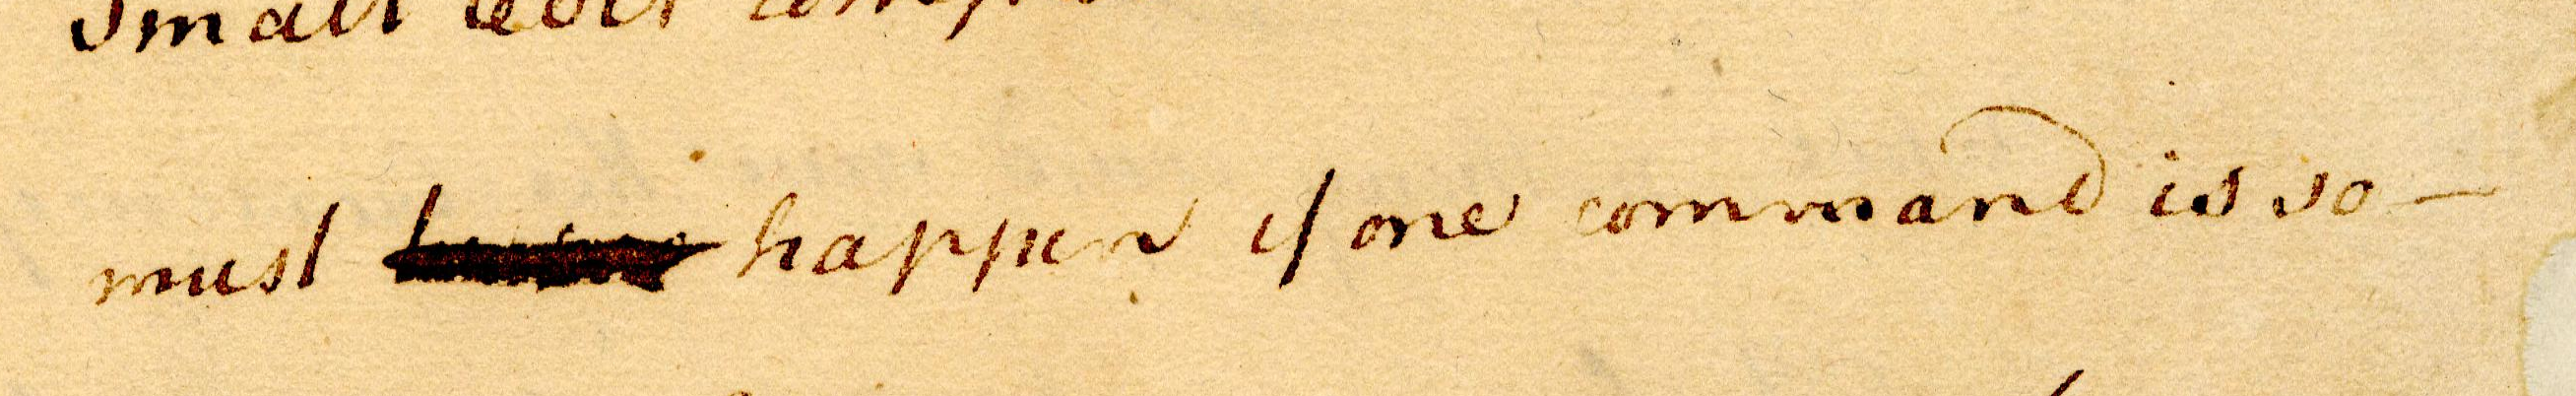must [_____] happen if one command is so-
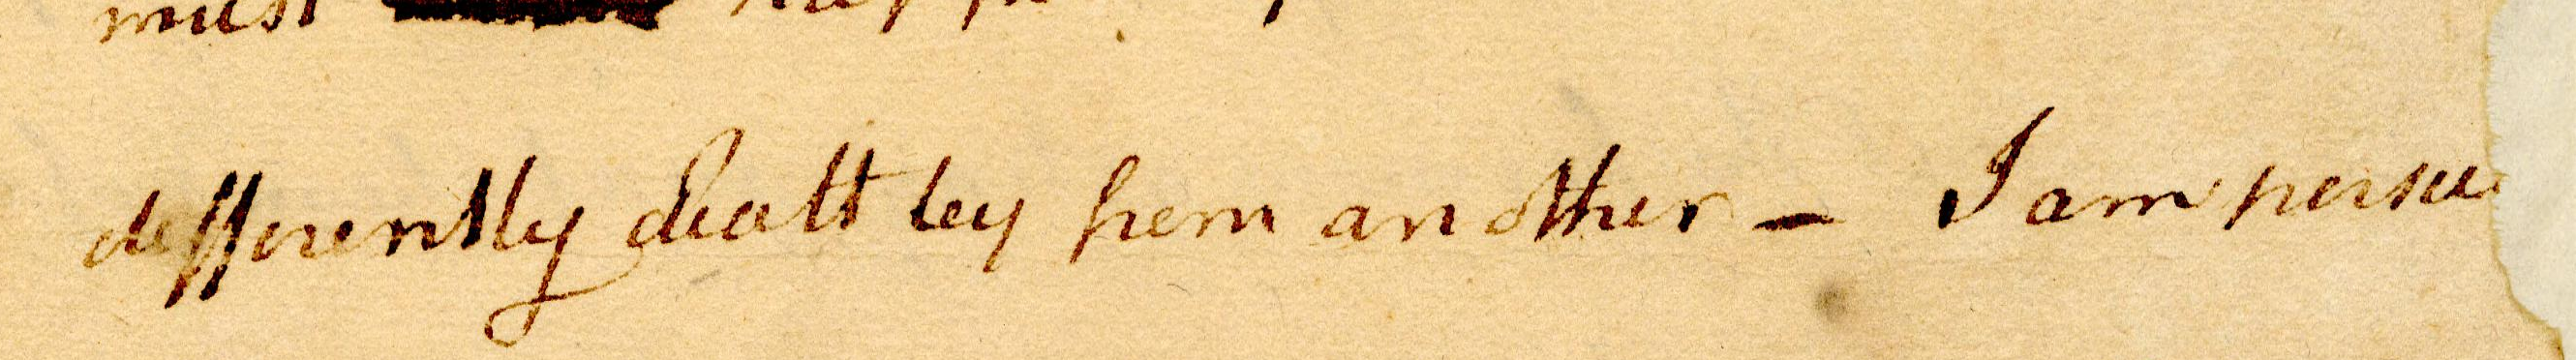differently dealt by from another- I am persu
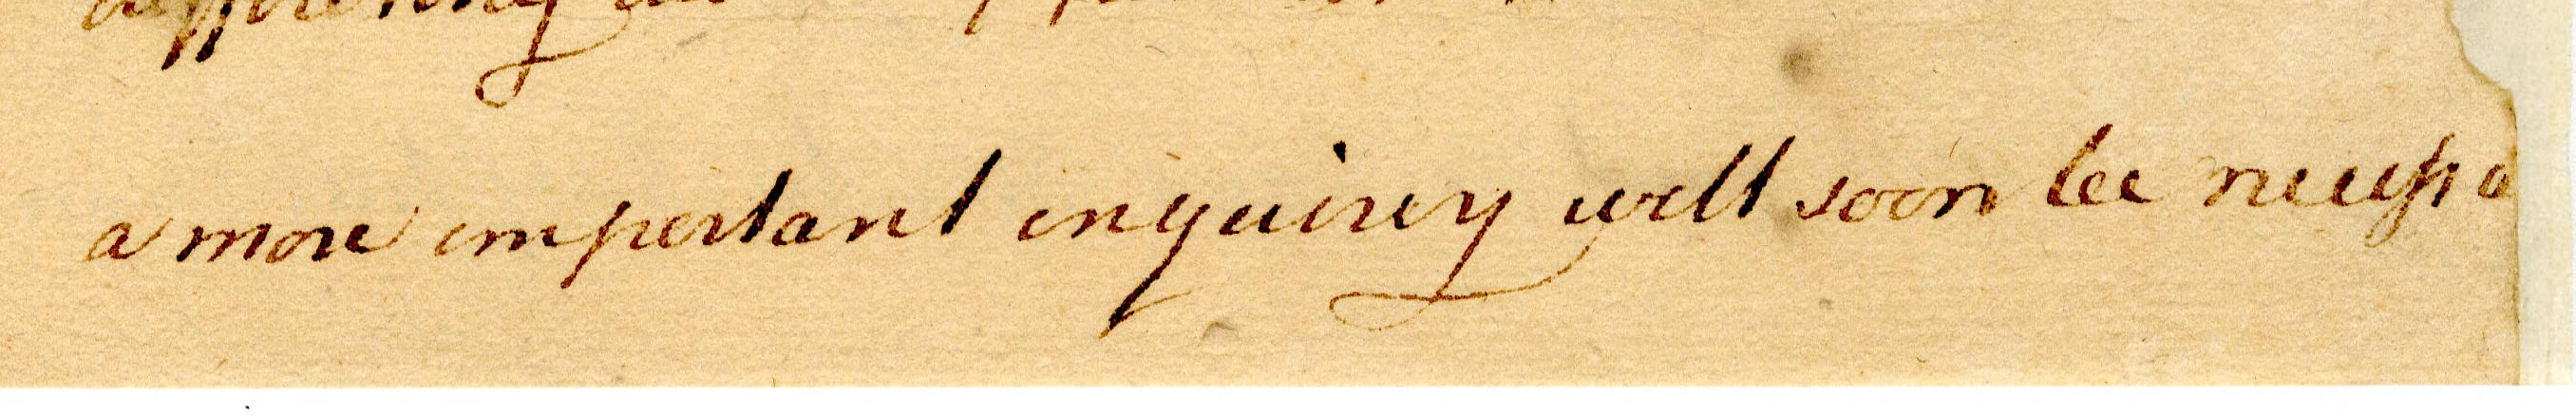a more important enquiry will soon be necessa
